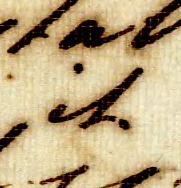it
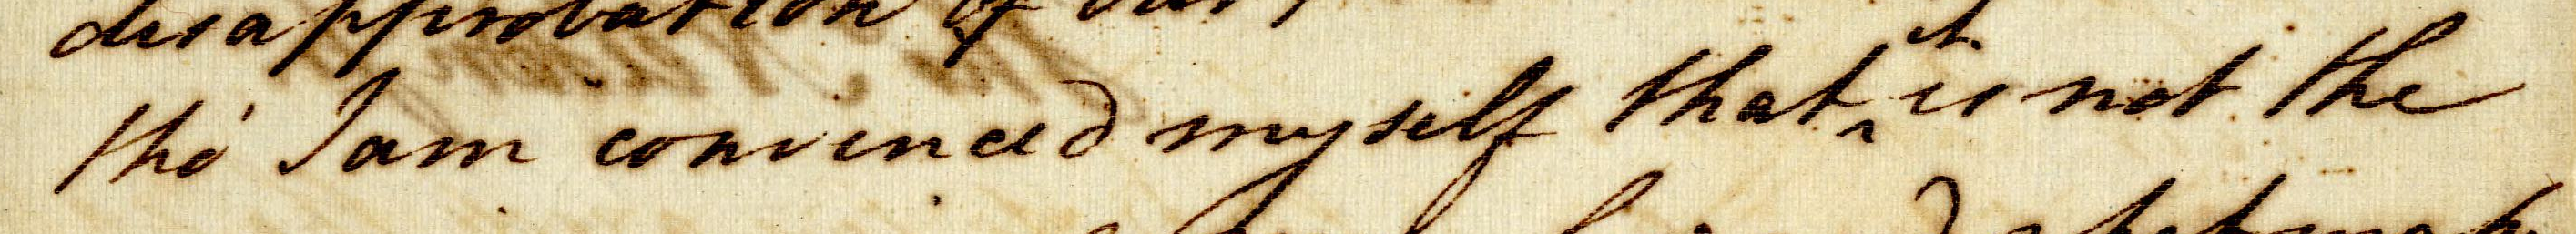tho' I am convinced myself that ^ is not the
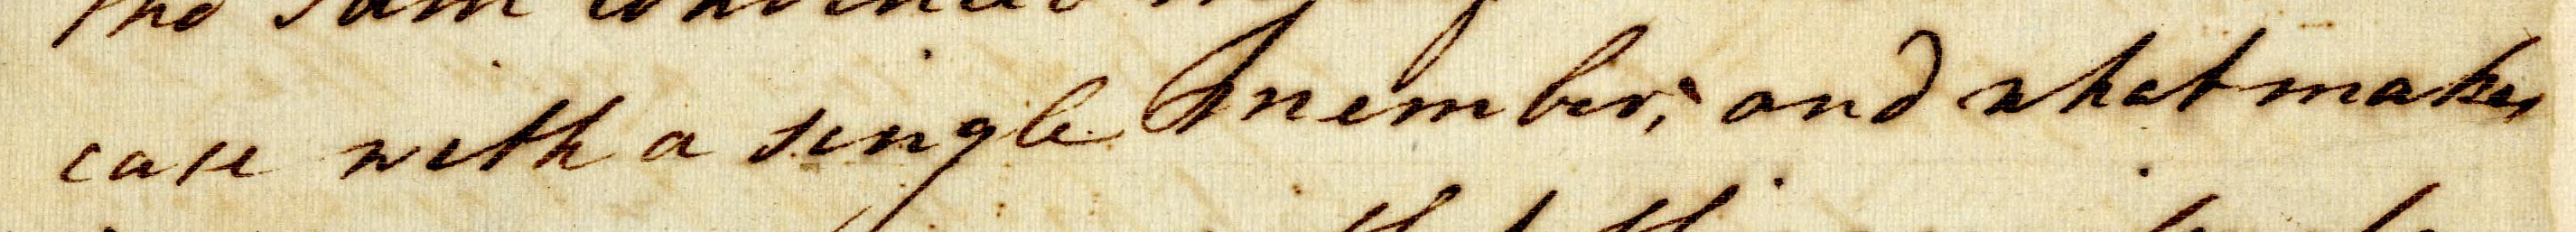case with a single member; and what makes
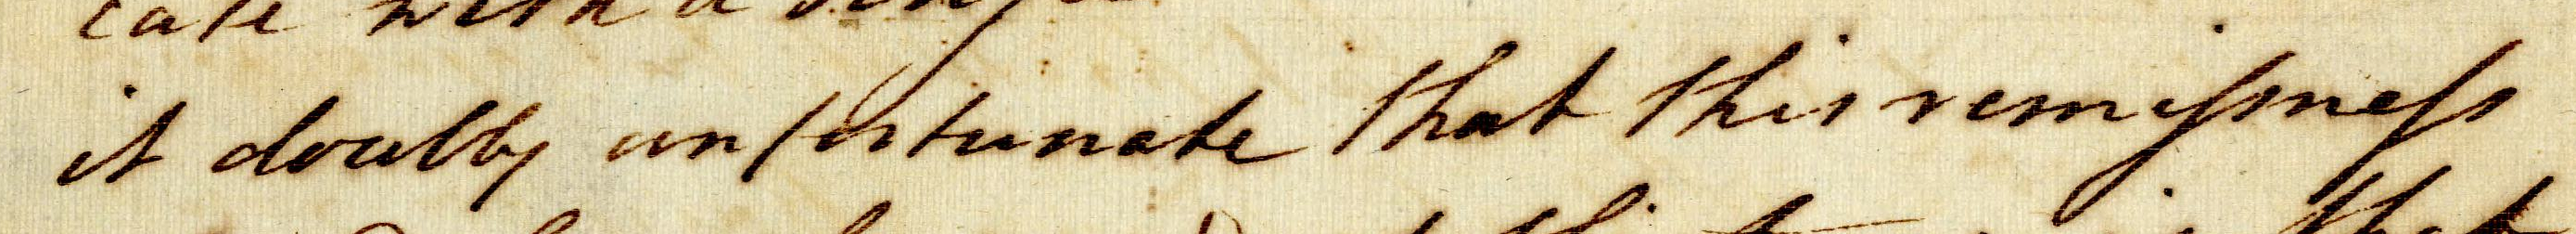it doubly unfortunate that this remissness
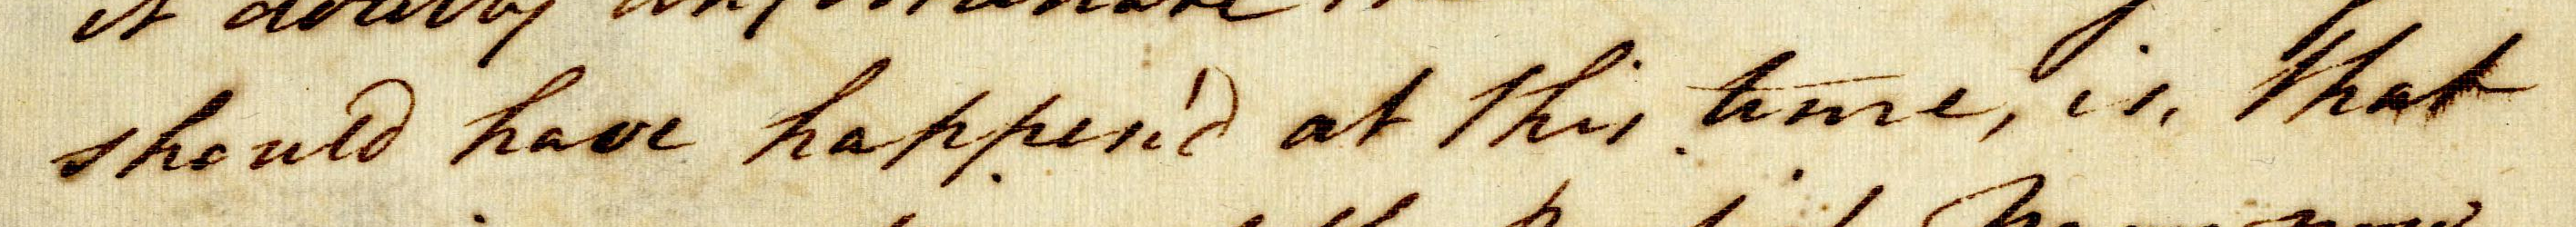should have happen'd at this time, is, that
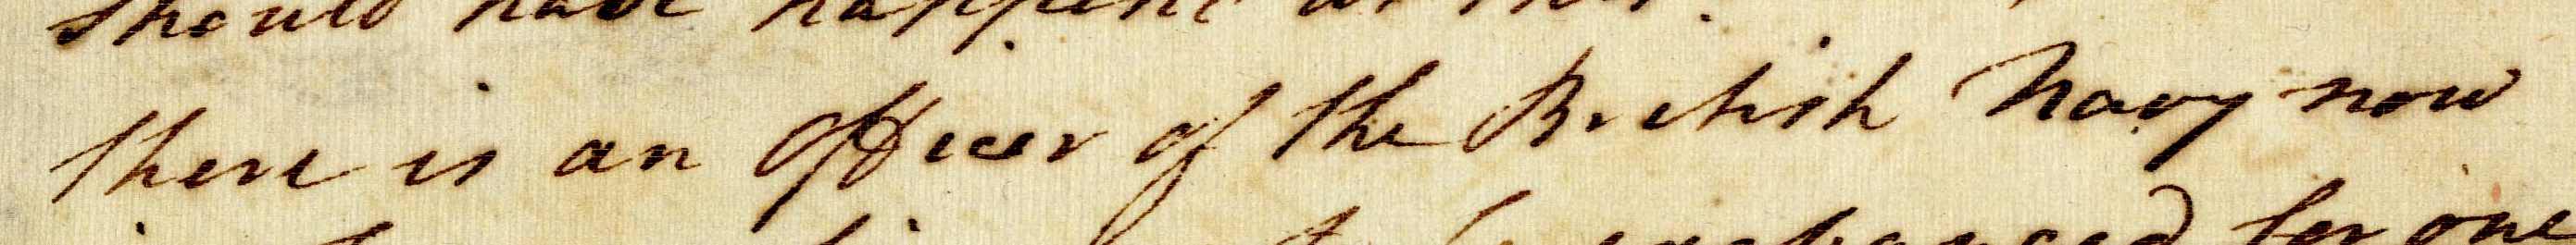there is an Officer of the British Navy now
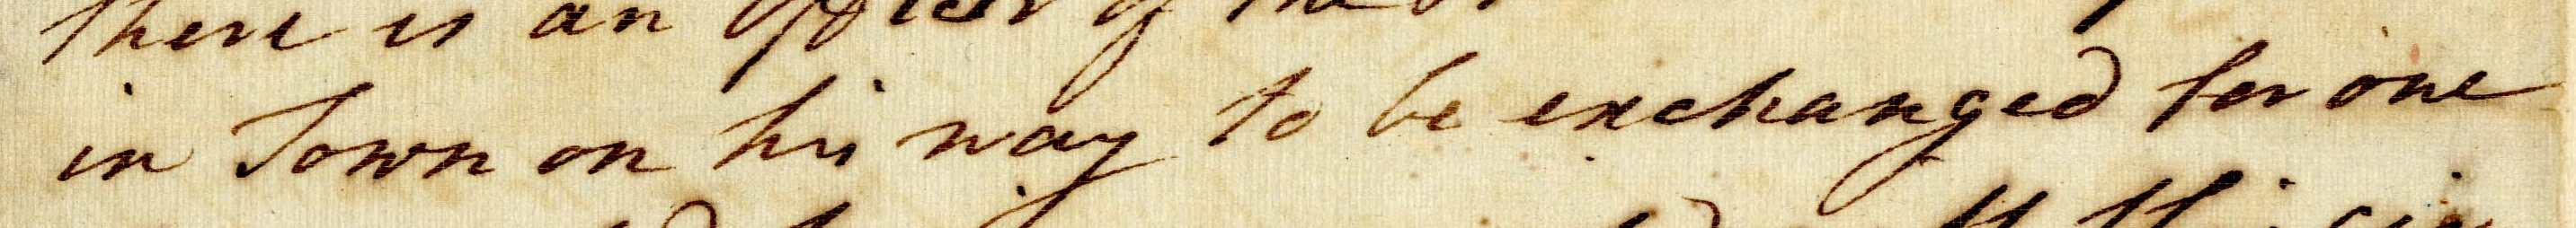in Town on his way to be exchanged for one
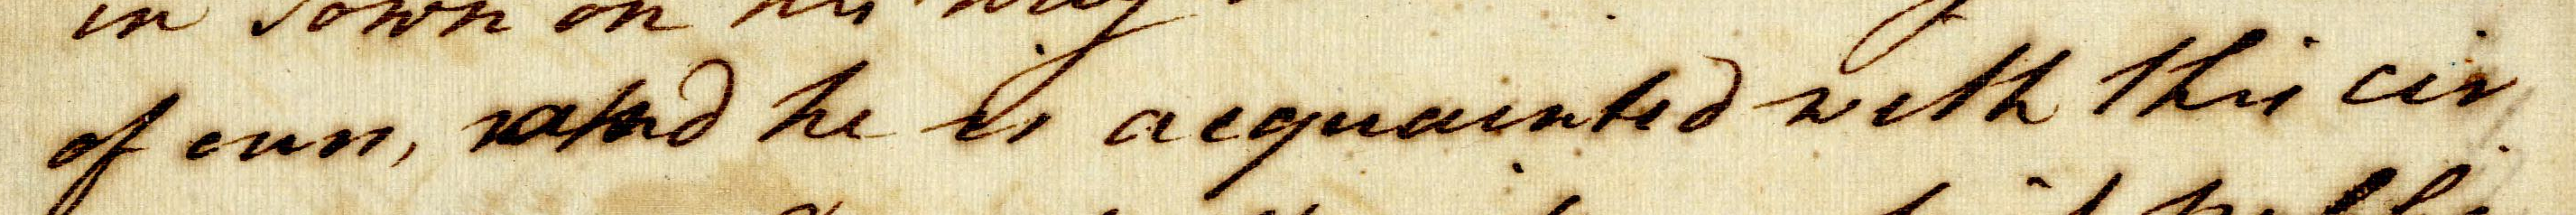of ours, and he is acquainted with this cir
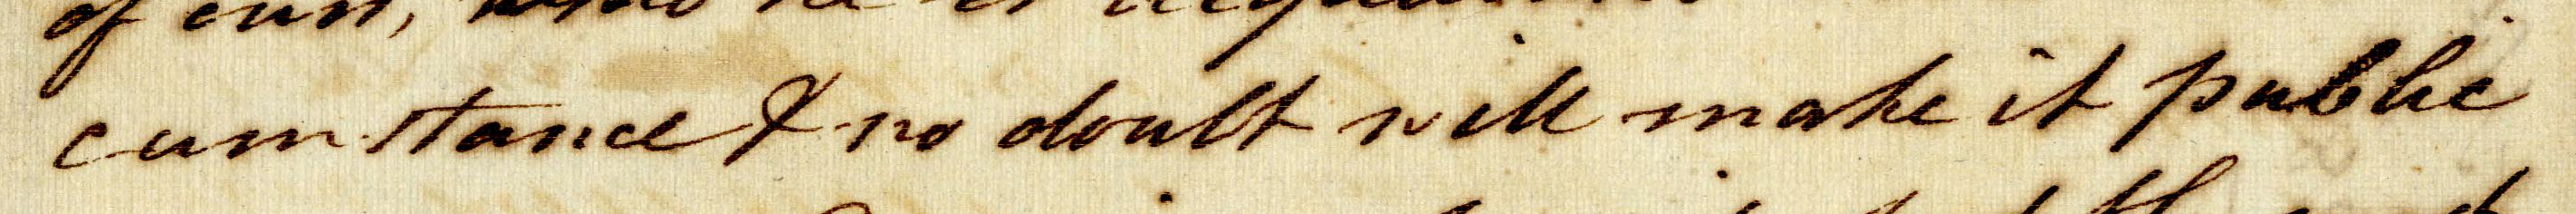cumstance & no doubt will make it public
